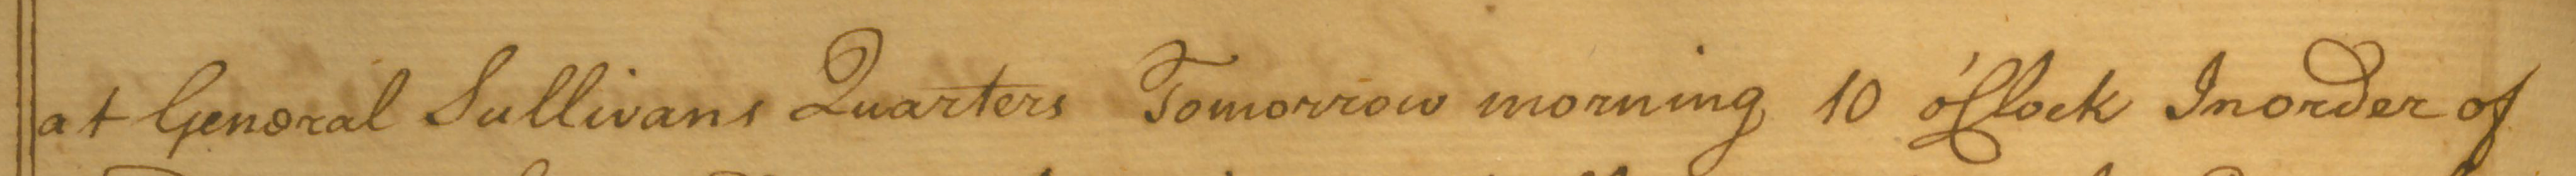at General Sullivans Quarters Tomorrow morning 10 o'Clock In order of
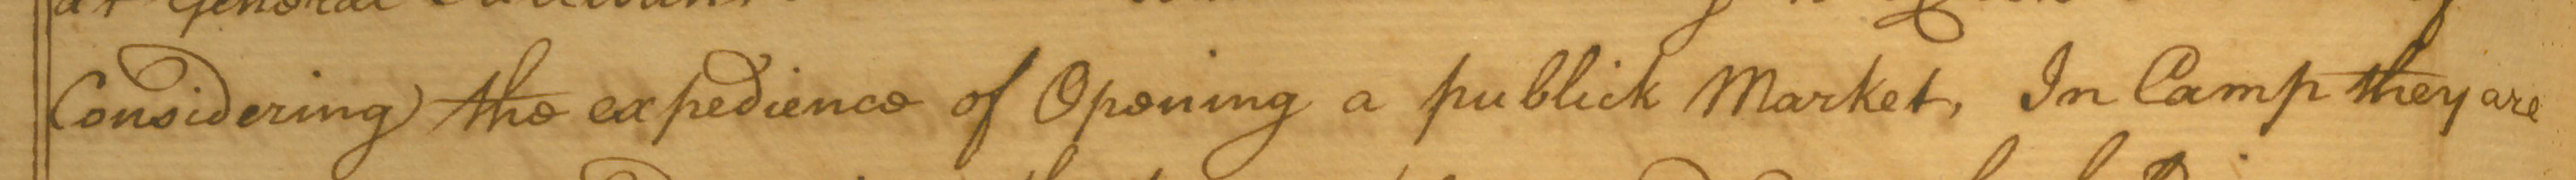Considering the expedience of Opening a publick Market, In Camp they are
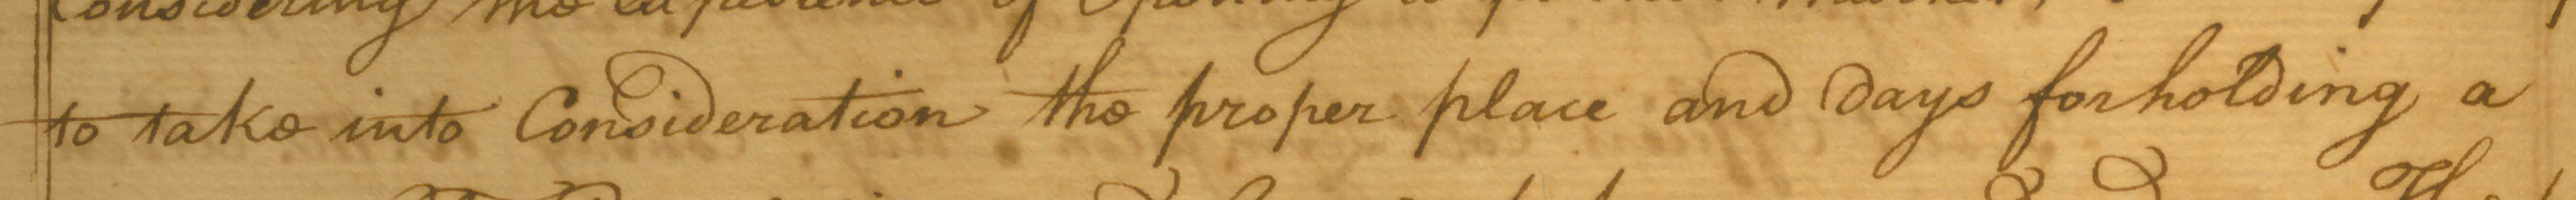to take into Consideration the proper place and days for holding a
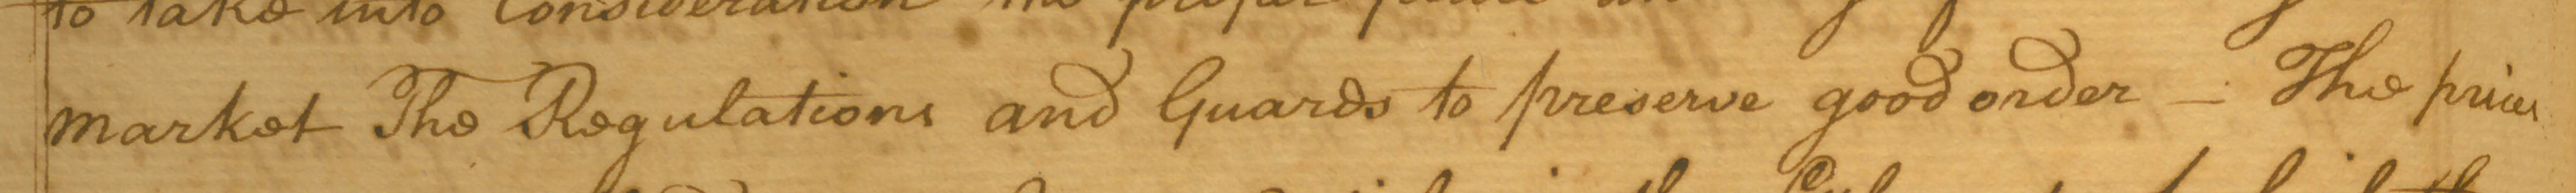market The Regulations and Guards to preserve good order- The prices
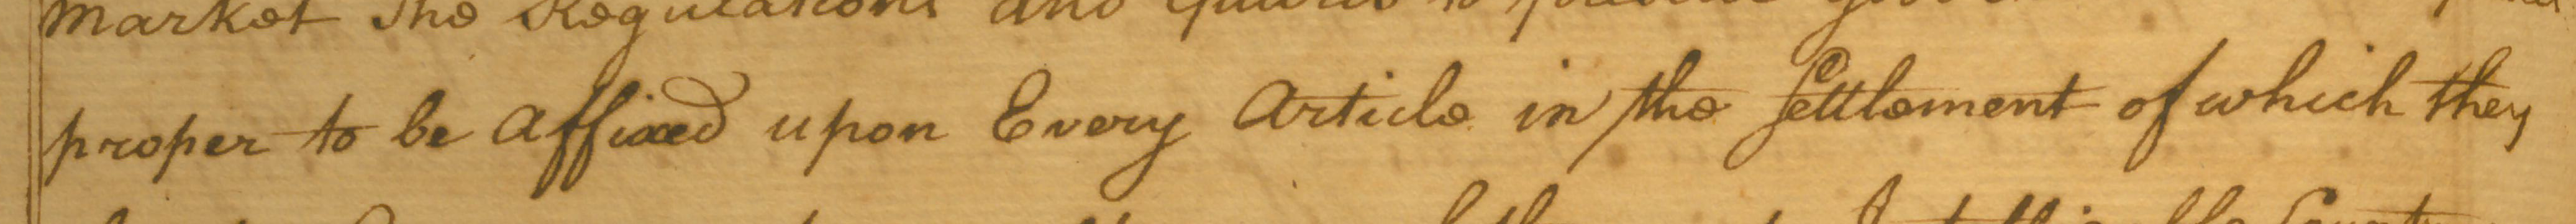proper to be affixed upon Every Article in the Settlement of which they
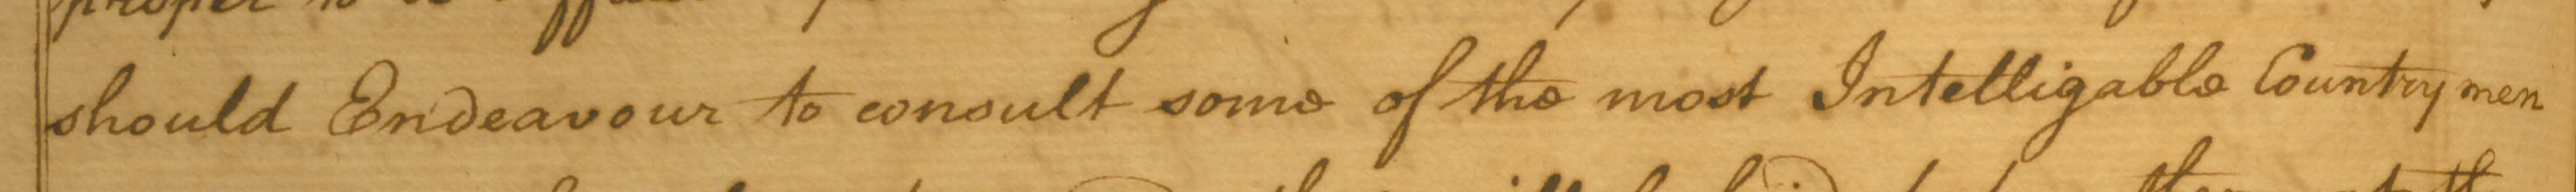should Endeavour to consult some of the most Intelligable Country men
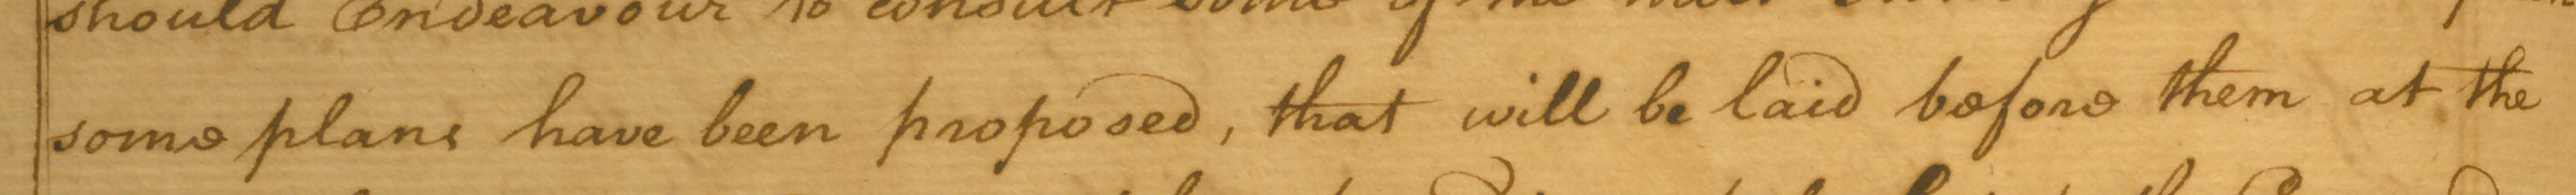some plans have been proposed, that will be laid before them at the
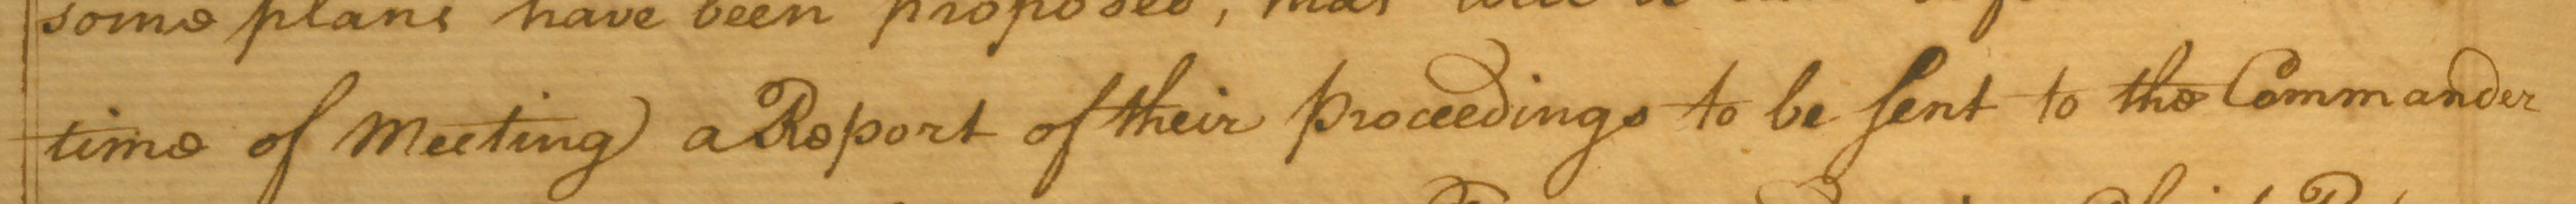time of Meeting a Report of their proceedings to be sent to the Commander
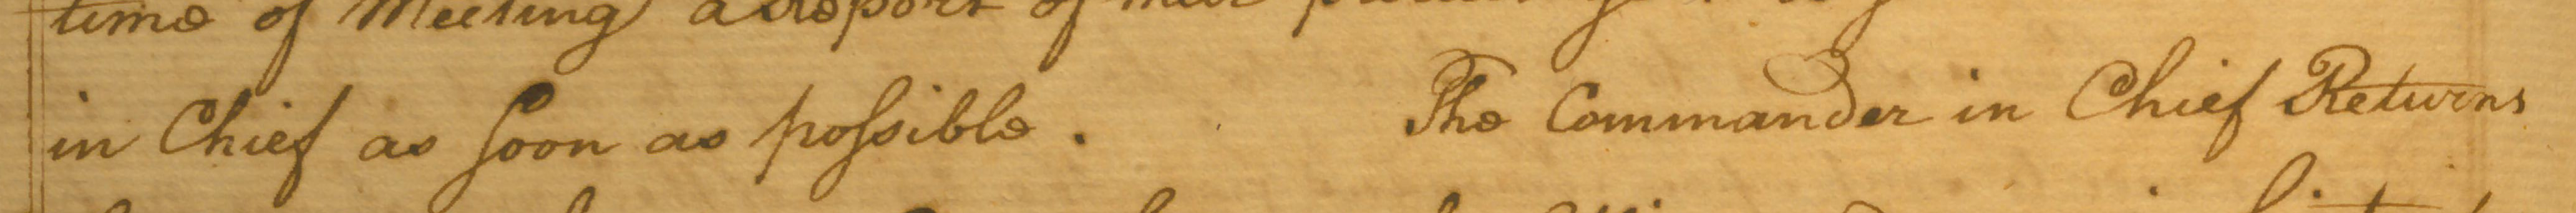in Chief as soon as possible. The Commander in Chief Returns
